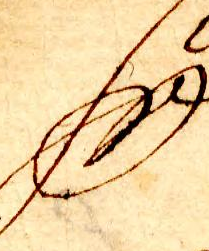Sir
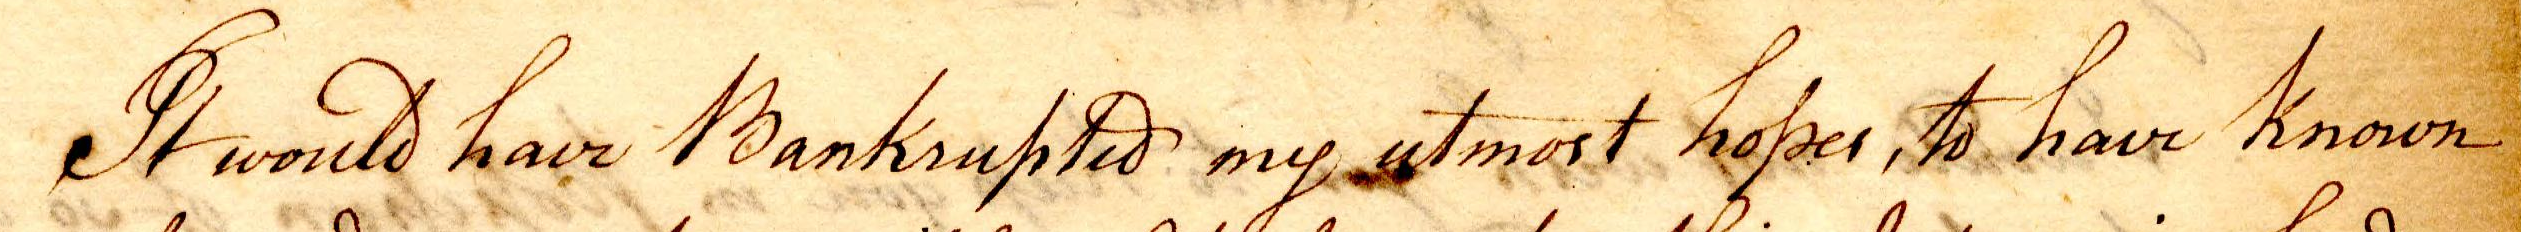It would have Bankrupted my utmost hopes, to have known
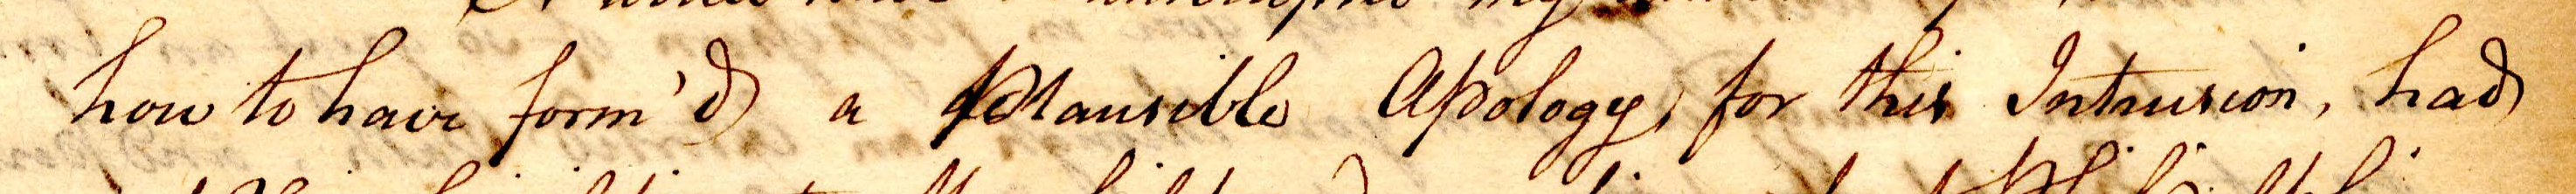how to have form'd a Plausible Apology for this Intrusion, had
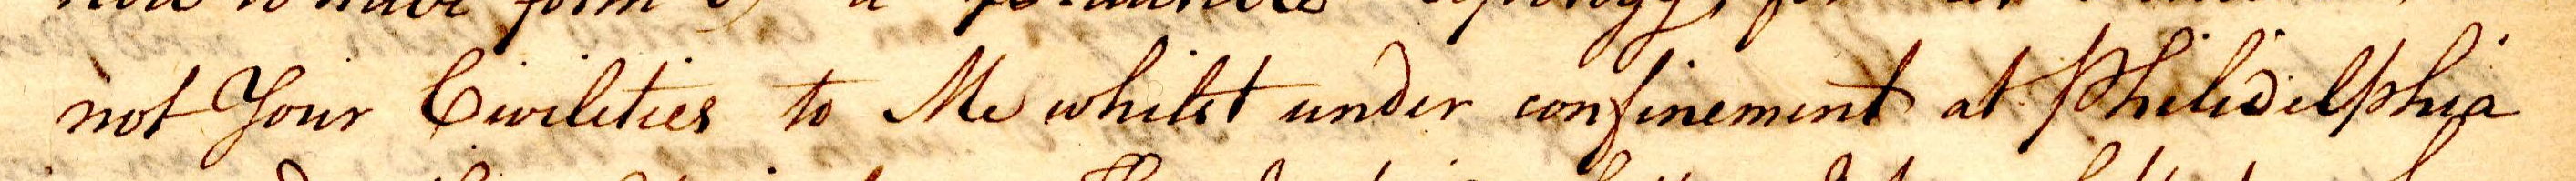not Your Civilities to Me whilst under confinement at Philidelphia
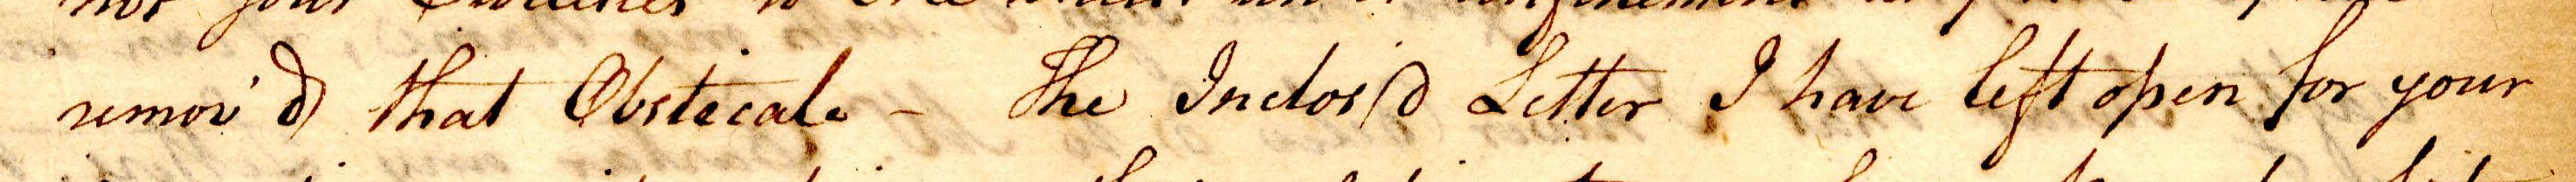remov'd that Obstecale The Inclos'd Letter I have left open for your
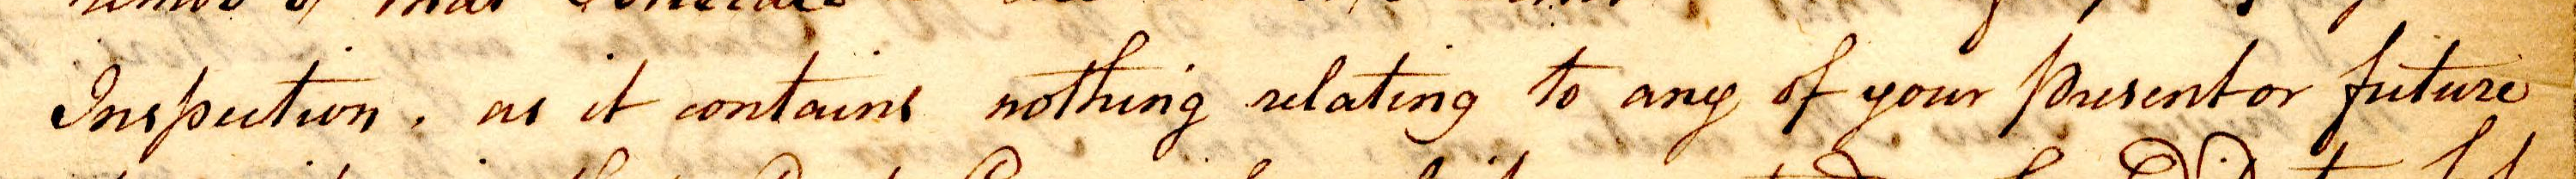Inspection, as it contains nothing relating to any of your Presentor future
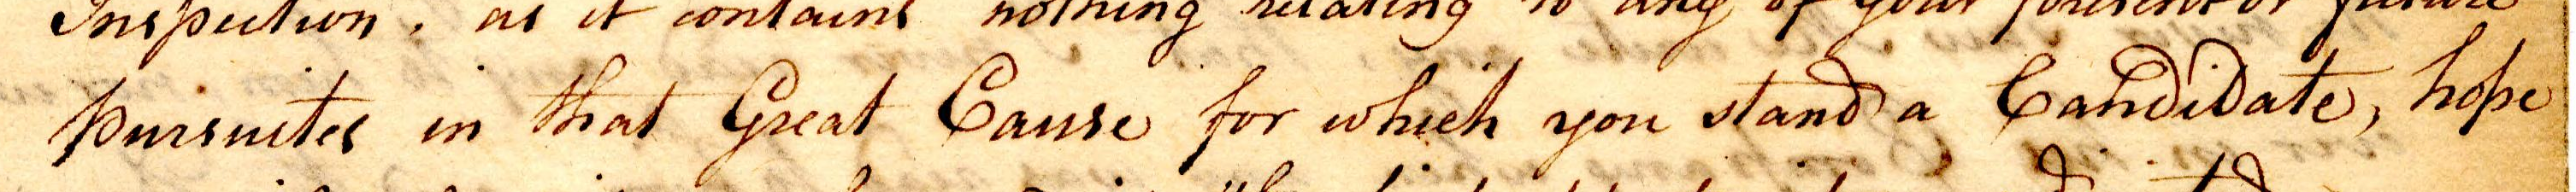pursuites in that Great Cause for which you stand a Candidate, hope
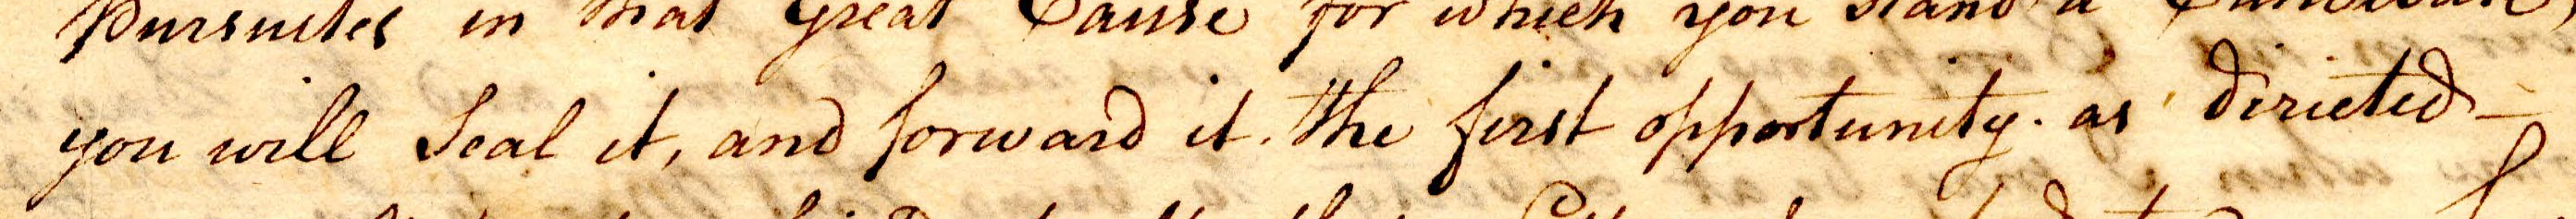you will Seal it, and forward it the first opportunity as directed.
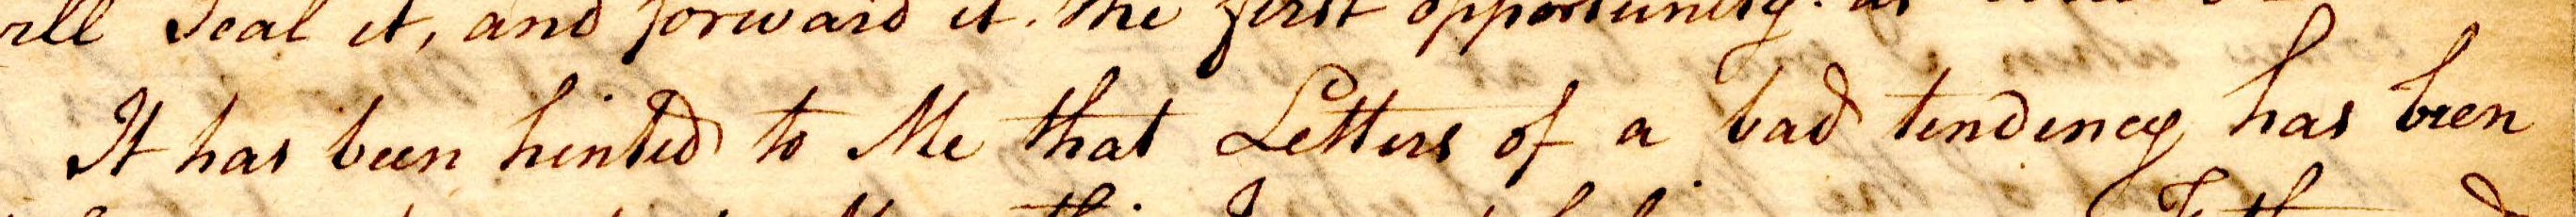It has been hinted to Me that Letters of a bad tendency has been
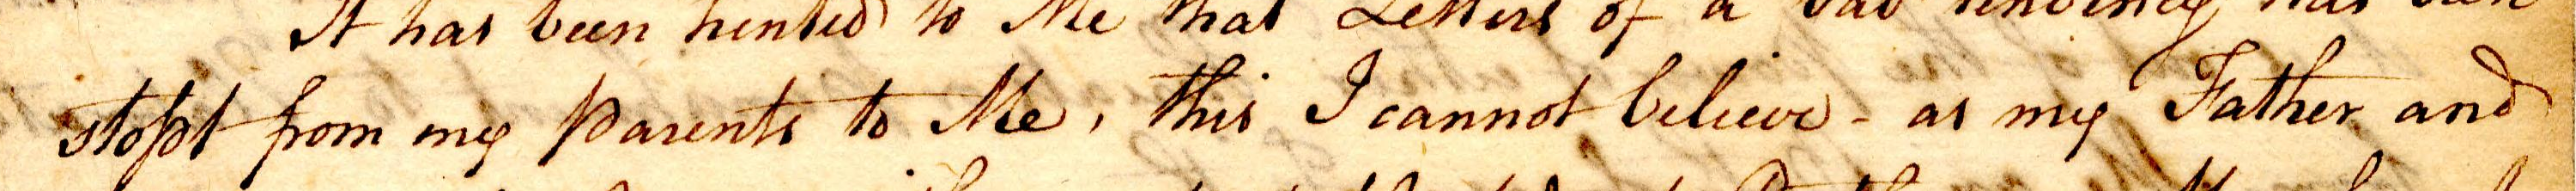stopt from my parents to Me, this I cannot believe. as my Father and
